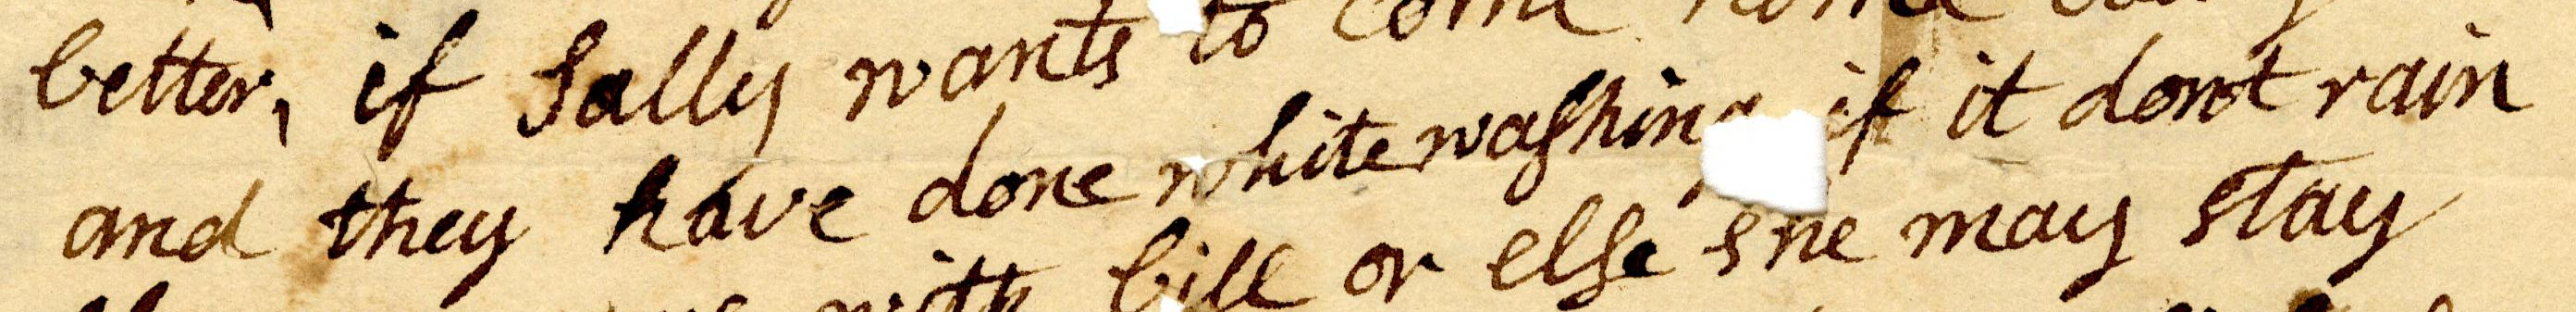and they have done whitewashing if it dont rain
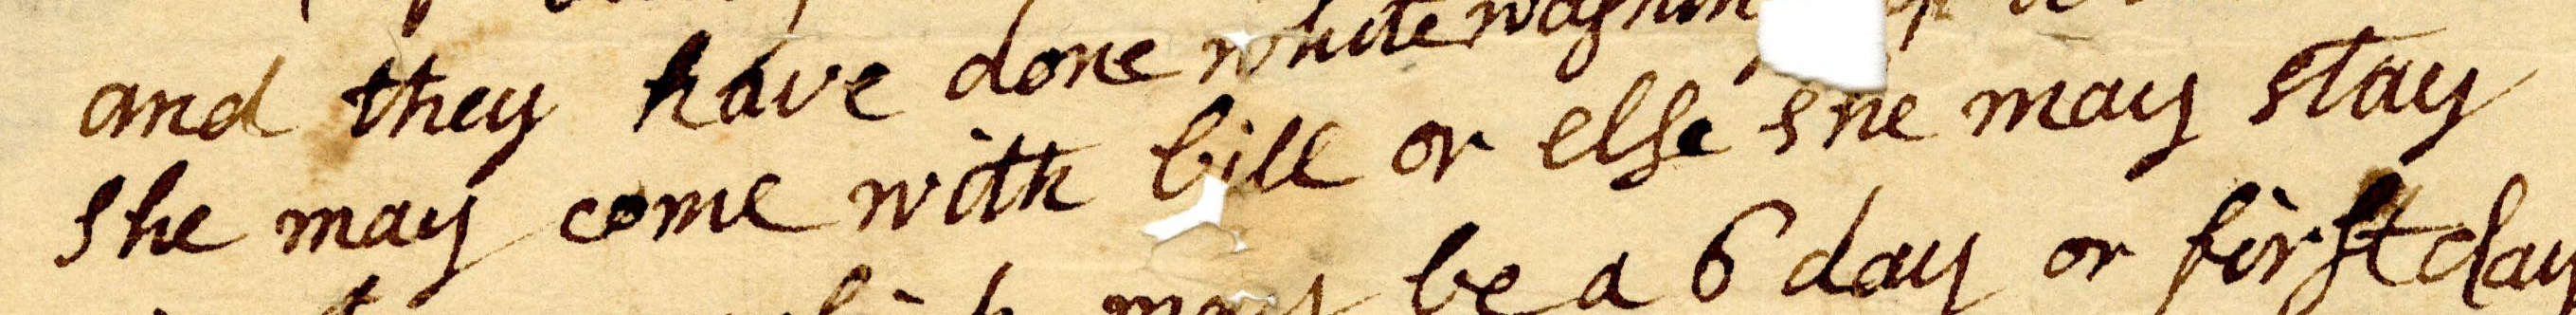She may come with bill of else she may stay
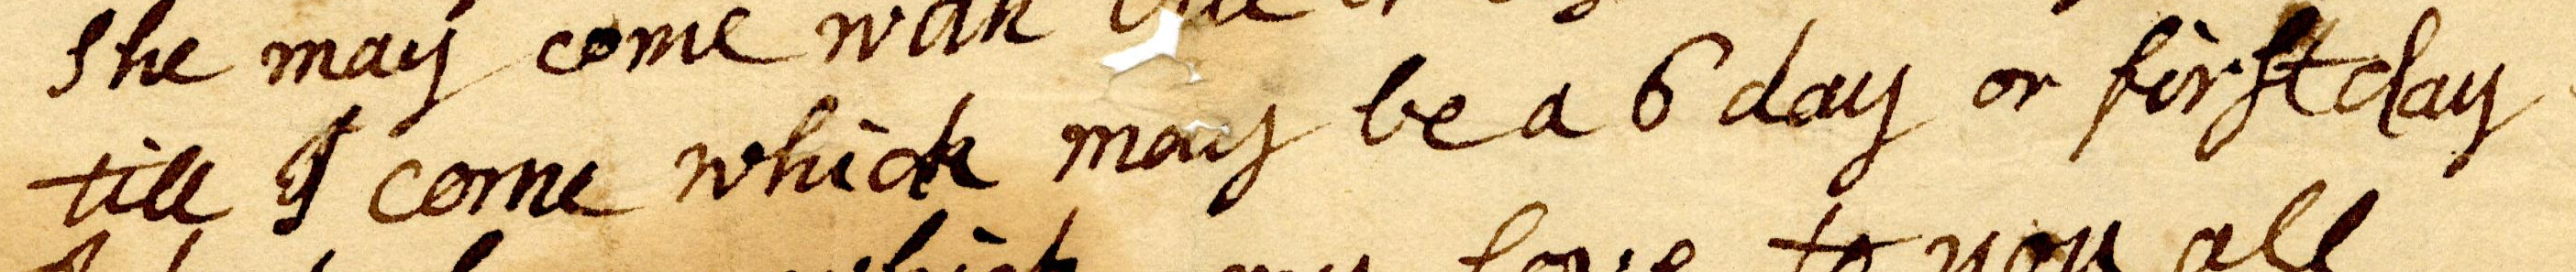till I come which may be a 6 day or first day
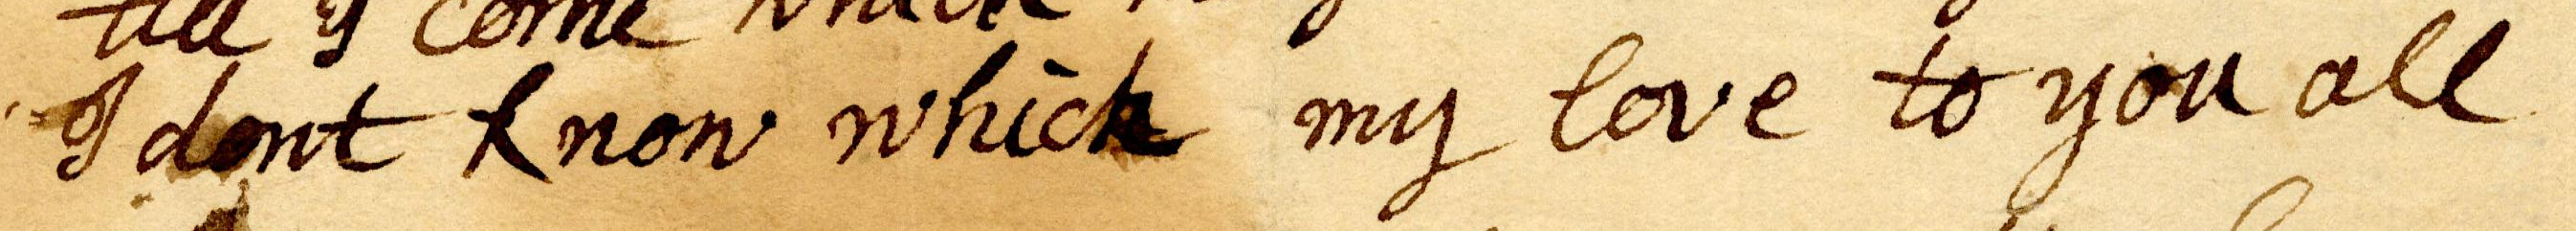I dont know which my love to you all
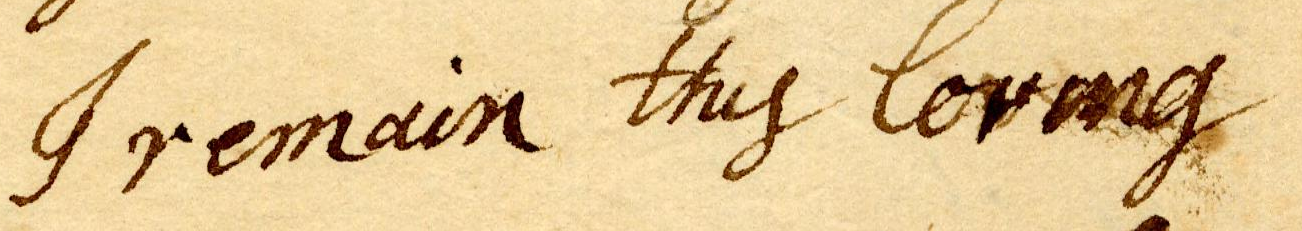I remain thy loving
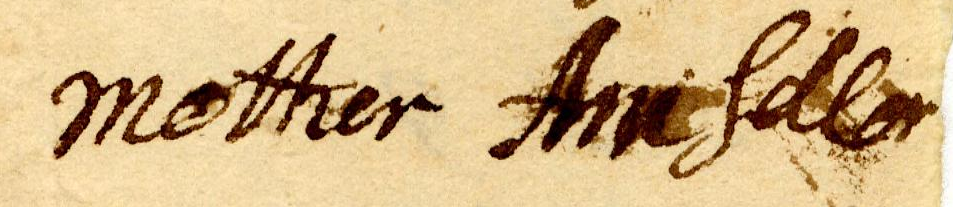mother Ann Seller
